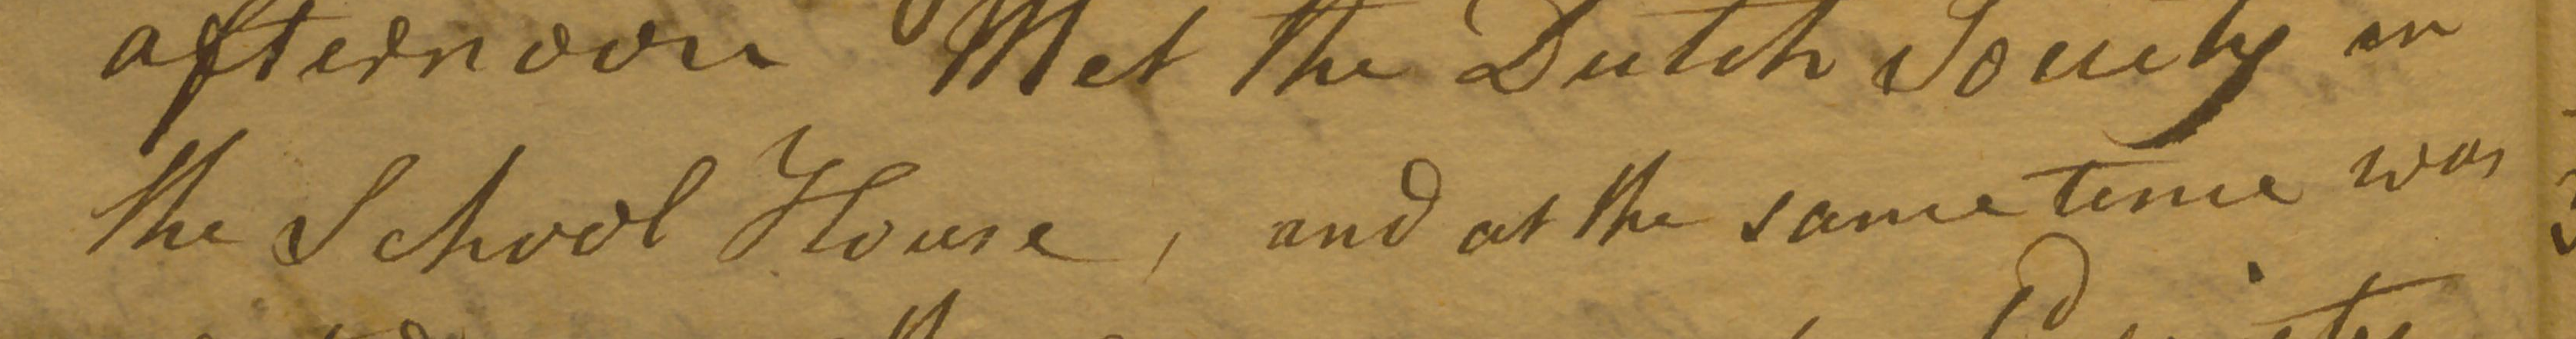the School House, and at the same time was
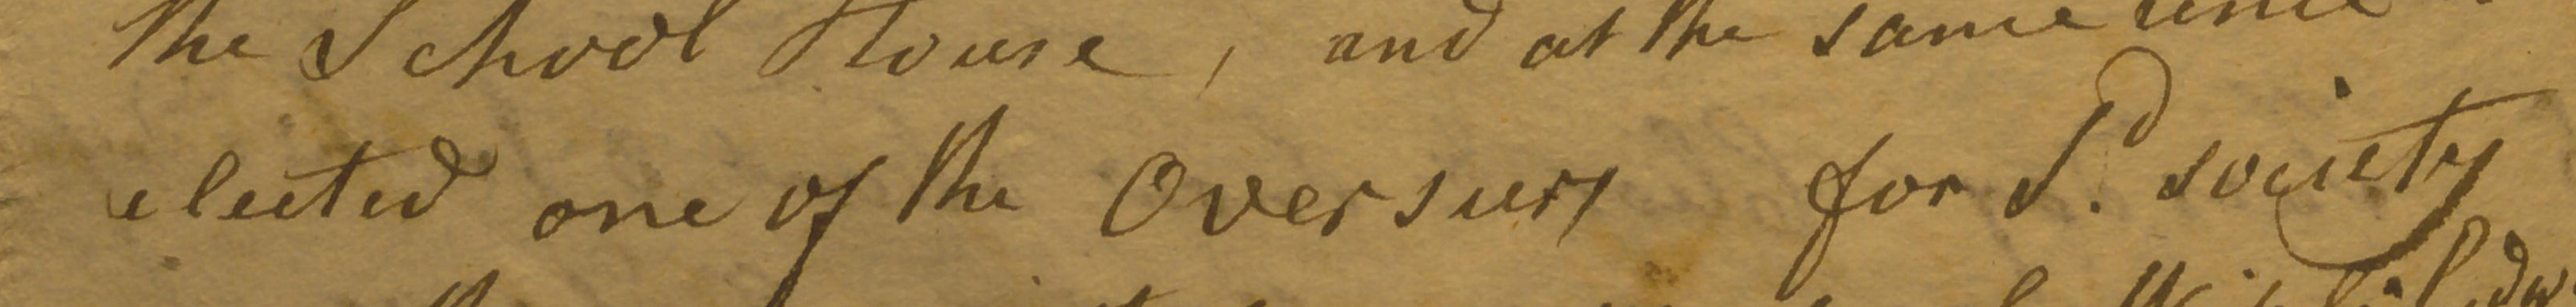elected one of the overseers for s^d. society
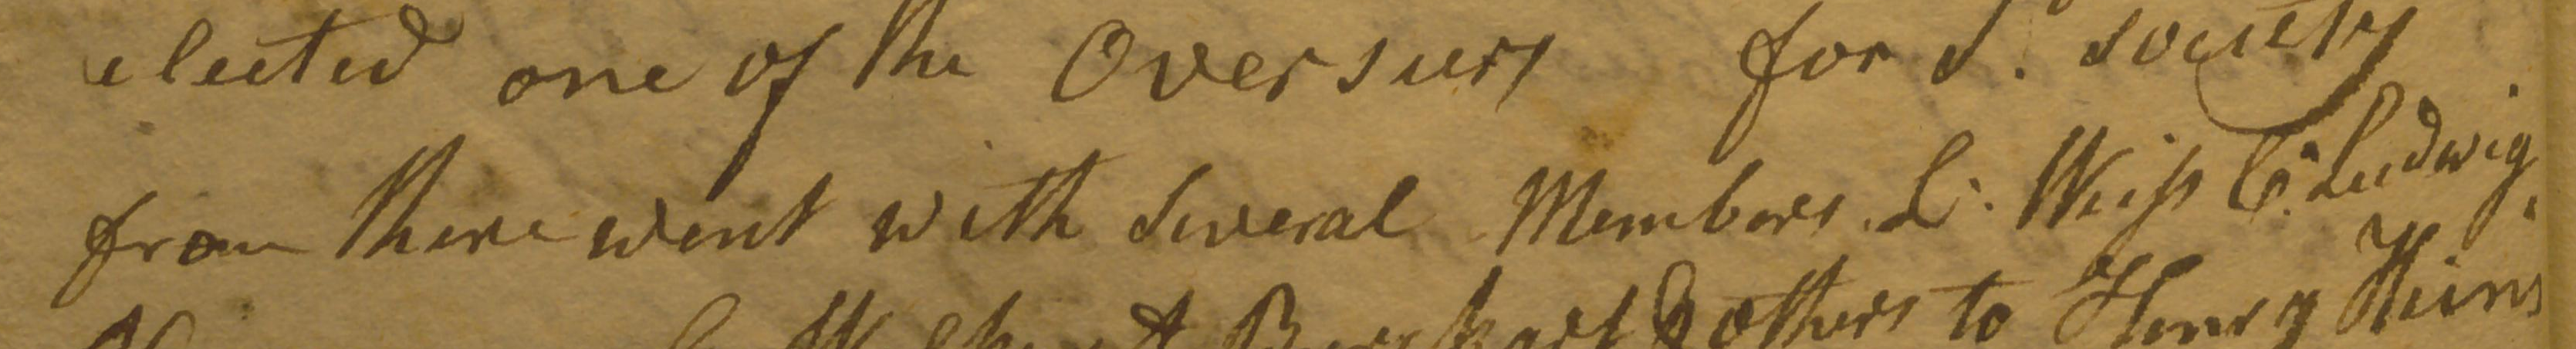from there went with Several Members L. Weiss C Ludwig
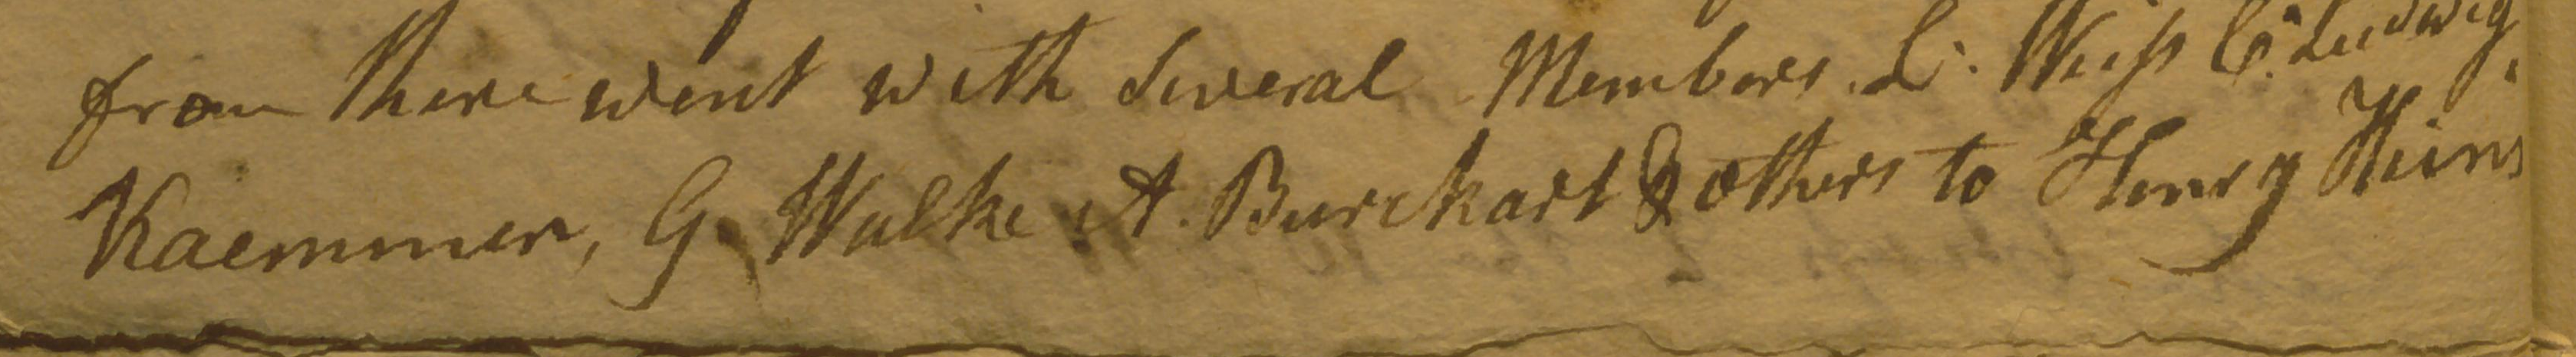Kaemmer, G. Walke A. Burckart 3 others to Henry Heins
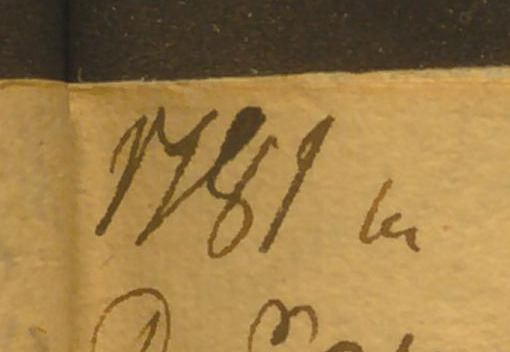1781
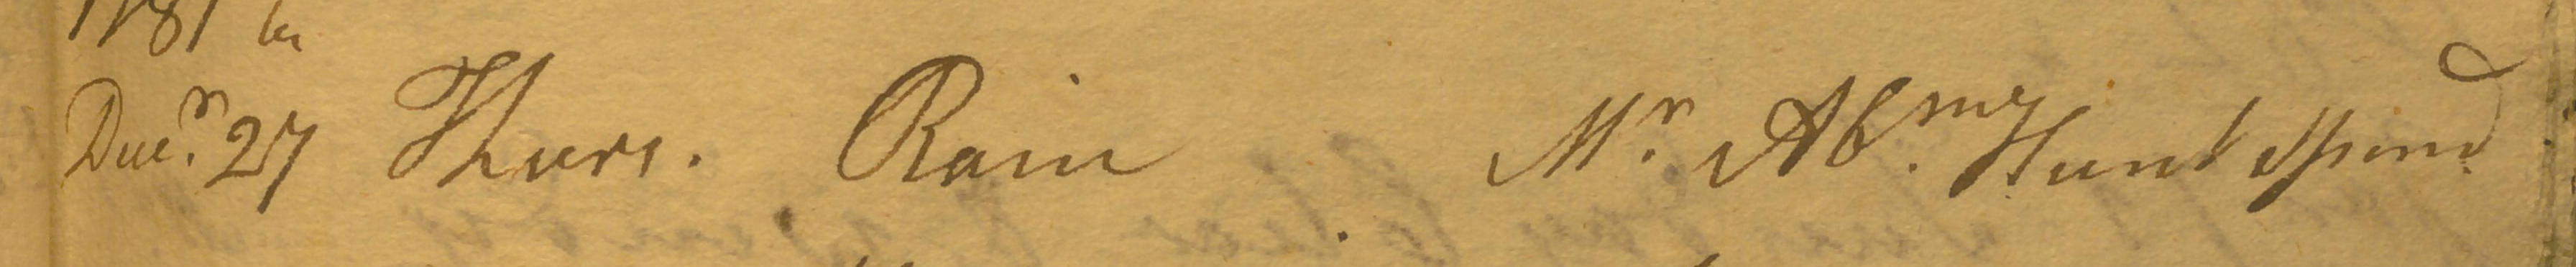Dec^r. 27 Thurs. Rain M^r. Ab^m. Hunt spend
